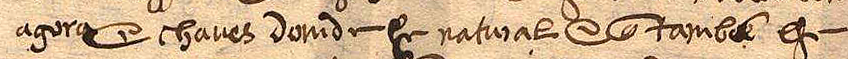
agora ē chaues donde he naturaL e q̄ tambē lhe
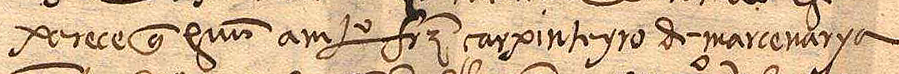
parece q̄ huū amto frz̄ carpinteyro de marcenarya
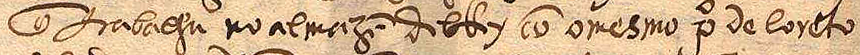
q̄ trabalha no almazē del Rey cō o mesmo po de loreto
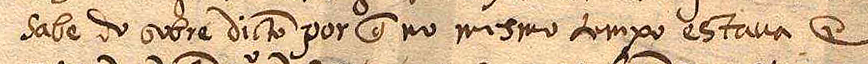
sabe do sobredicto porq̄ no mesmo tempo estaua ē
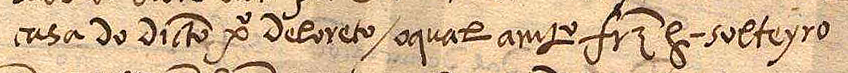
casa do dicto po de loreto / o quaL amto frz̄ he solteyro
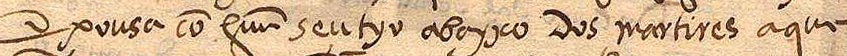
e pousa c̄o hūu seu tyo abayxo dos martires a que
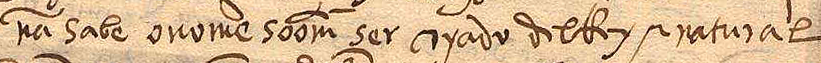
n̄a sabe o nome soomte ser cryado del Rey e naturaL
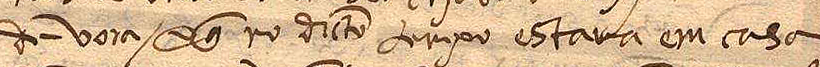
devora / e q̄ no dicto tempo estaua em casa
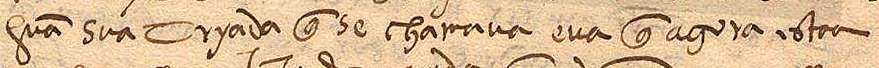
huā sua Cryada q̄ se chamaua eua q̄ agora estaa
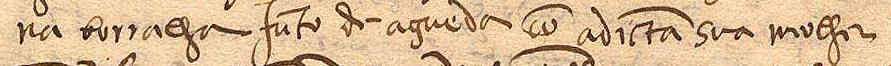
na borralha Jūto de agueda c̄o a dicta sua molher
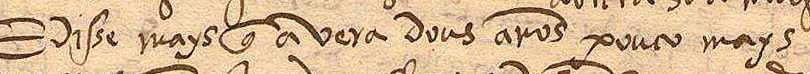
E disse mays q̄ avera dous ānos pouco mays
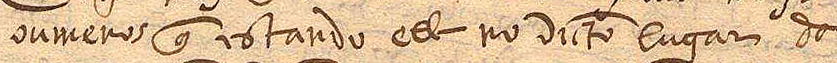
ou menos q̅ estando elle no dicto lugar da
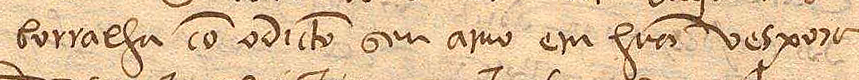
borralha c̄o o dicto seu amo em huā vespora
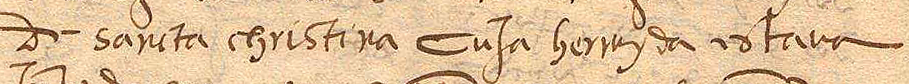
de sancta christina CuJa hermyda estaua
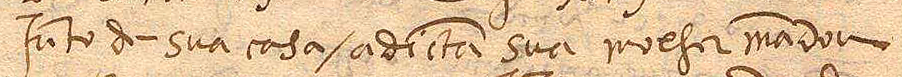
Jūto de sua casa / a dicta sua molher m̅adou
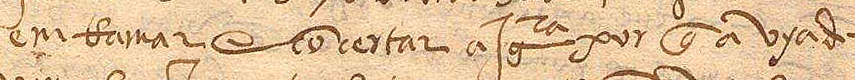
emRamar e cōcertar a Jgra porq̄ avya de
